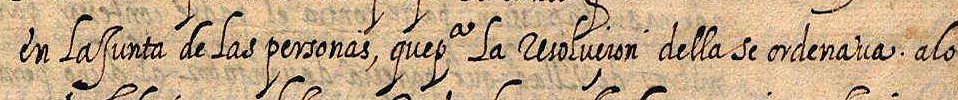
en la Junta de las personas, que pa la Resolucion della se ordenaua a lo
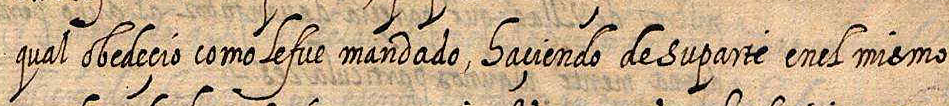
qual obedecio como le fue mandado, haciendo de su parte en el mismo
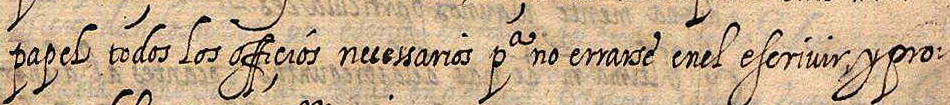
papel todos los officios necessarios pa no errarse en el escriuir, y pro
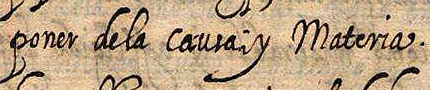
poner de la causa y Materia.
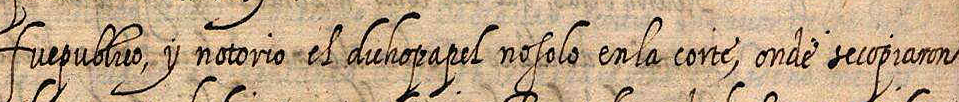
Fue publico, y notorio el dicho papel no solo en la corte, onde se copiaron
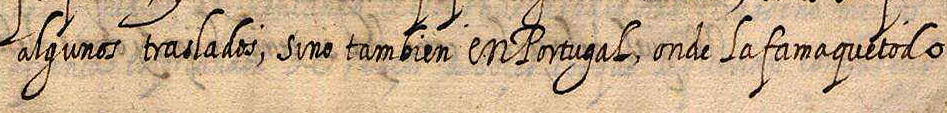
algunos traslados, sino tambien en Portugal, onde la fama que todo
